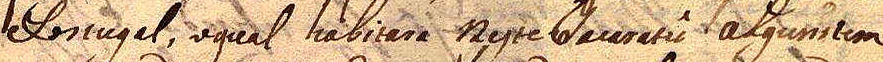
Portugal, o qual habitara neste Tacaratú aLguns tem
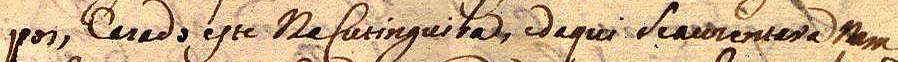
po, Cazado este Na Cutinguita, e daqui Se auzentara nam
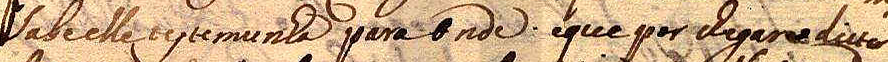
Sabe elle testemunha para onde e que por chegar o dicto
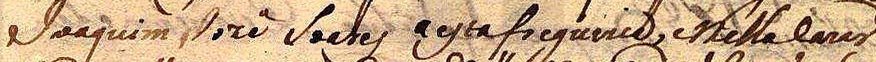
Ioaquim Iozé Soares a esta freguezia, e nella Cazar
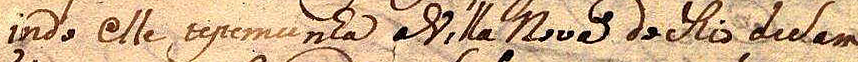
indo elle testemunha a Villa Nova do Rio de Sam
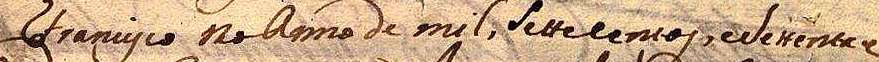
Francisco no anno de mil, settecentos, e settenta e
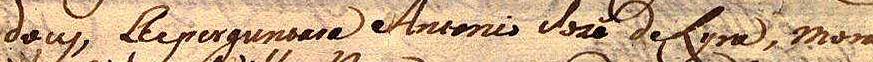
dous, Lhe perguntara Antonio Iozé de Lyra, mora
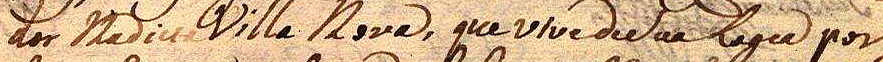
dor Na dicta Villa Nova, que vive de Sua Logia por
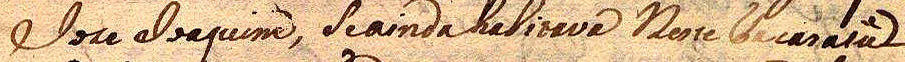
Ioze Ioaquim, se ainda habitava Neste Tacaratú,
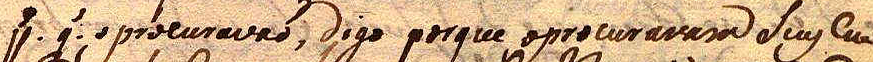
pr.q̄. o procuravaõ, digo porque o procuravam Seus Cu
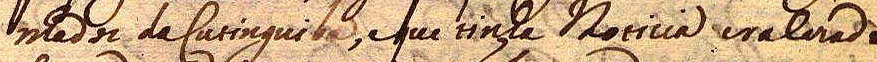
nhadoz da Cutinguiba, e que tinha Noticia era Cazada
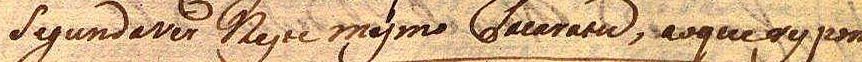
segunda ves Neste mesmo Tacaratú, ao que respon
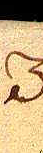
3
